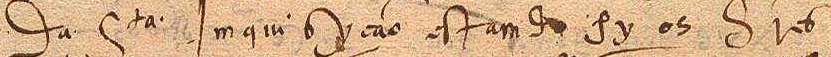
da Sta Jmquisyção estamdo hy os Sr̅es
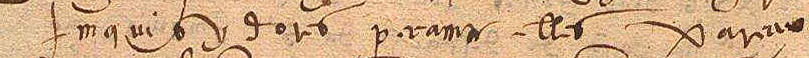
Jmquisydores peramte elles pareçeo
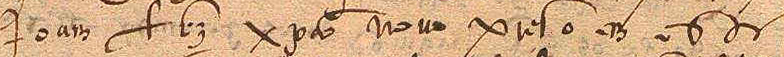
Joam fr̅z xpa̅o nouo preso em este
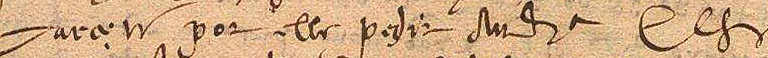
carçere por elle pedir Aud̅a e lhe
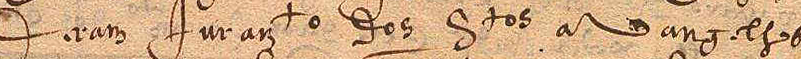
deram Juramto dos Stos avangelhos
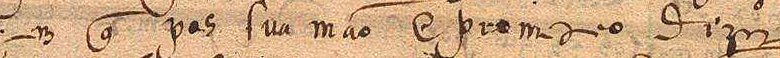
em q̅ pos sua mão e prometeo dizer
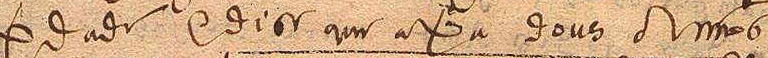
ꝟdade e dise que aꝟa dous Ann̅os
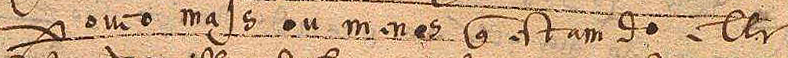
pouco majs ou menos q̅ estamdo elle
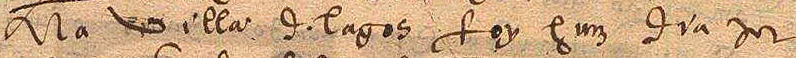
na villa de lagos foy hum dia ter
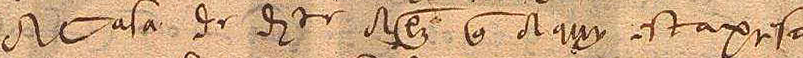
A Casa de d̅te Al̅z q̅ Aquy esta preso
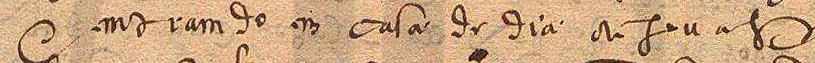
e emtramdo em Casa de dia Achou ahy
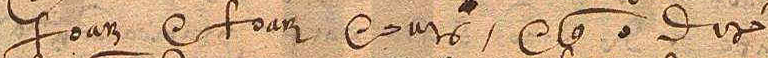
foam e foam e outos / e q̅ o dito
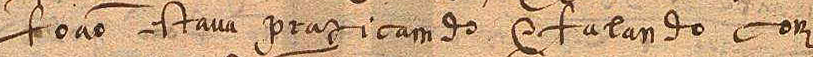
foão estaua praticamdo e falando com
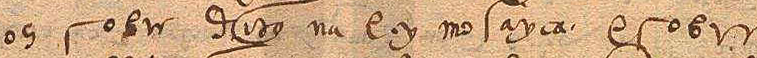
os sobre di̅tꝯ na ley mosayca . e sobre
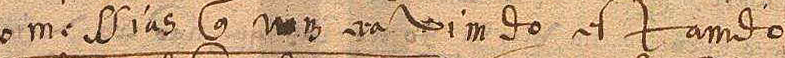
o messias q̅ nom era vimdo estamdo
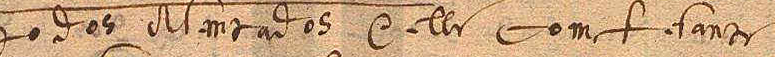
todos Asemtados e elle comfesante
